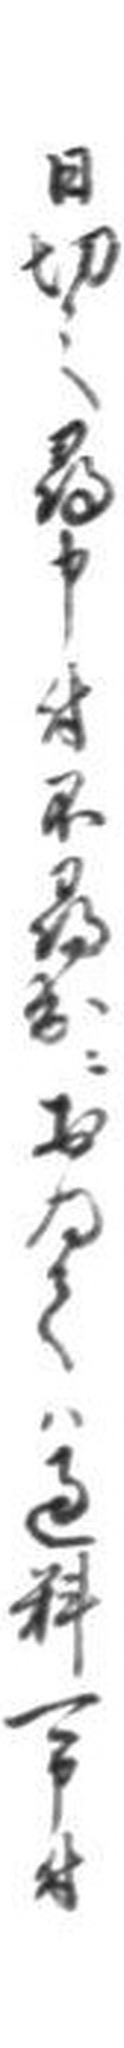日切之尋申付不尋出ニおゐてハ過料可申付

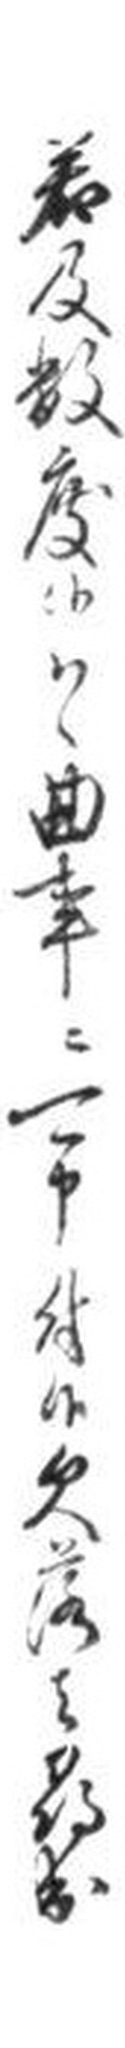若及数度候ハヽ曲事ニ可申付候欠落者尋出
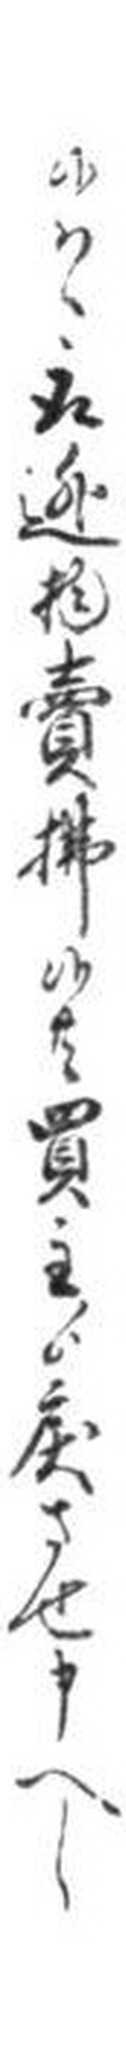候ハヽ取逃物売払候共買主ゟ戻させ申へし
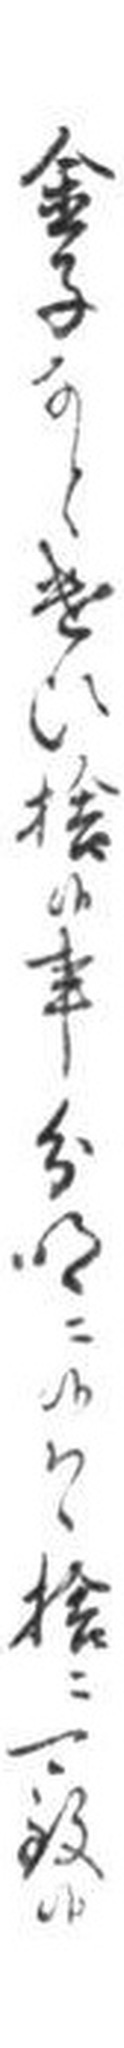金子なと遣ひ捨候事分明ニ候ハヽ捨ニ可致候
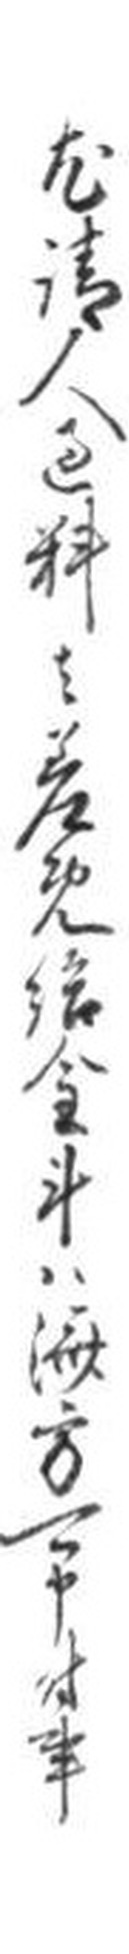尤請人過料者差免給金斗ハ済方可申付事
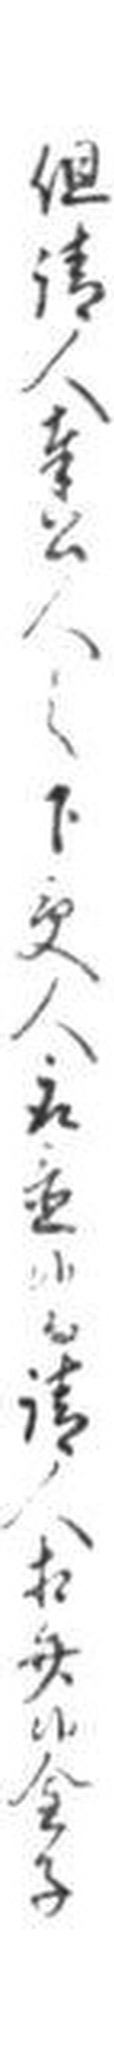但請人奉公人之下受人取置候而請人相弁候金子
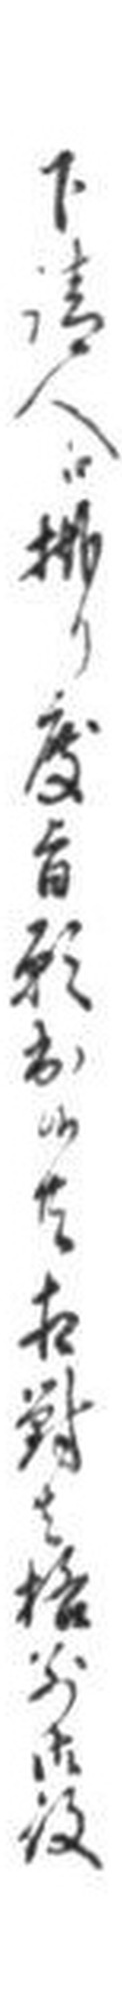下請人江掛り度旨願出候共相対者格別御役
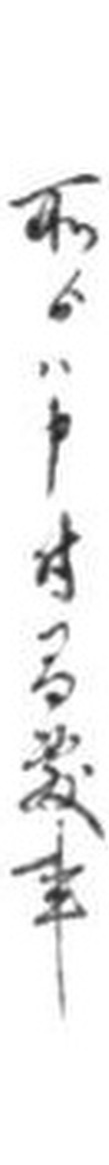所ゟハ申付間敷事
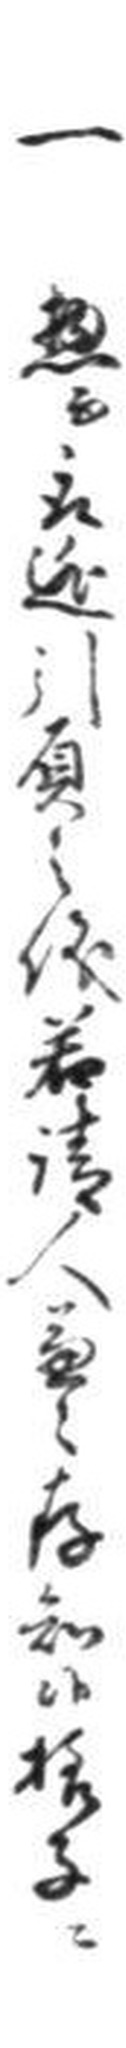一惣而取逃引負之儀若請人兼々存知候様子ニ
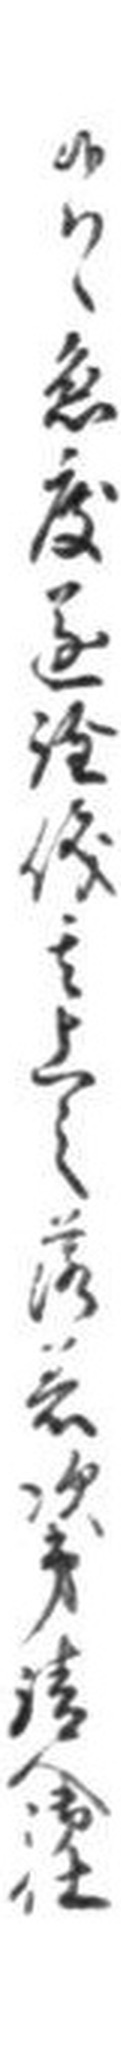候ハヽ急度遂詮儀其上之落着次第請人御仕
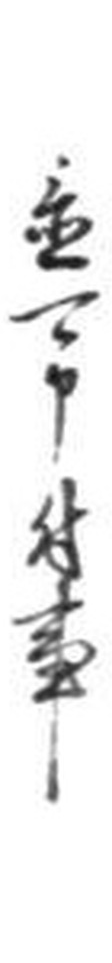置可申付事
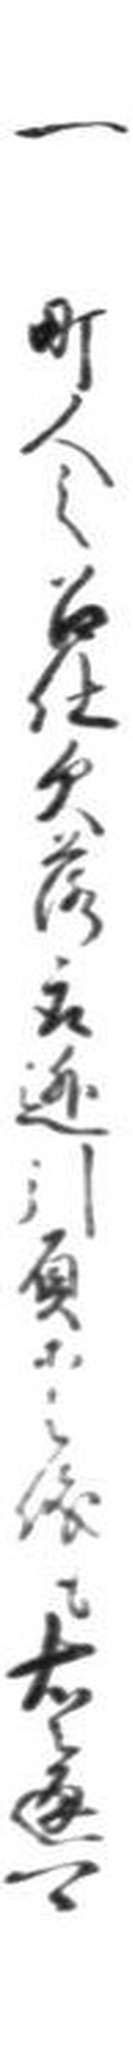一町人之召仕欠落取逃引負等之儀も右之通可
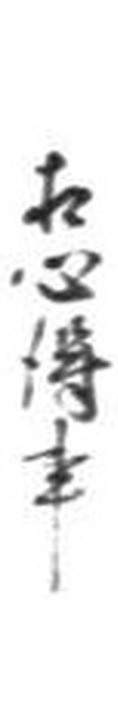相心得事
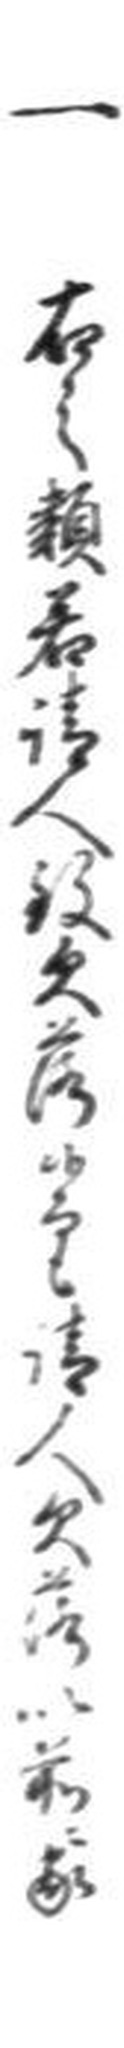一右之類若請人致欠落候而も請人欠落以前ニ家
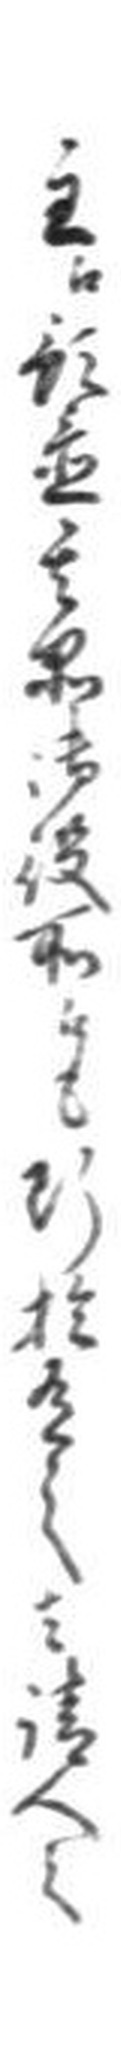主江預置其品御役所江も断於有之者請人之
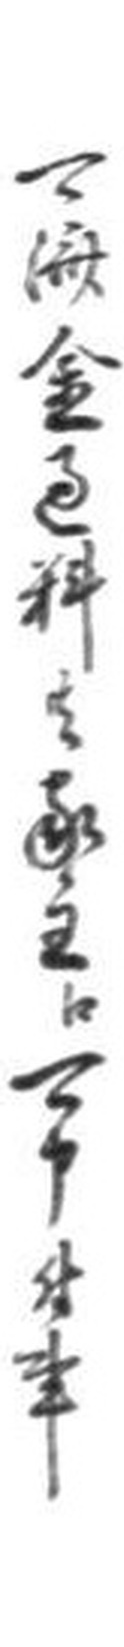可済金過料共家主江可申付事
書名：家譜 三十三 吉邦公 享保四年
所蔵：福井県文書館 Fukui Prefectural Archives
